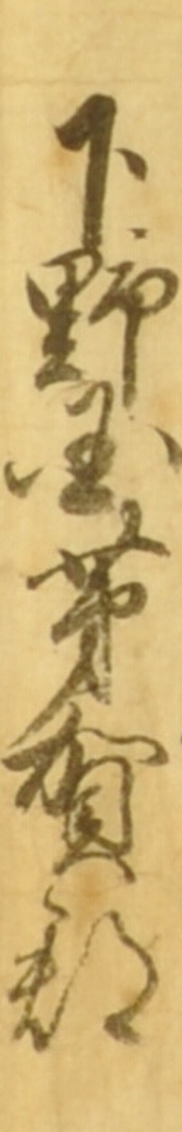下野国芳賀郡

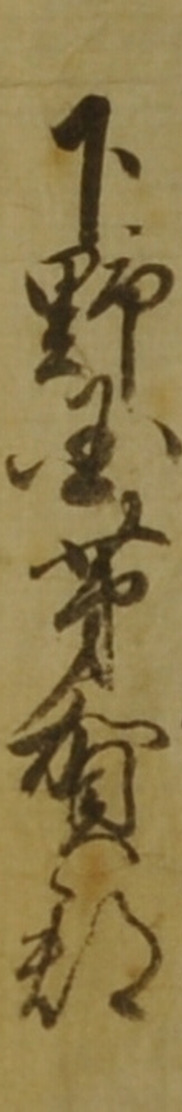下野国芳賀郡
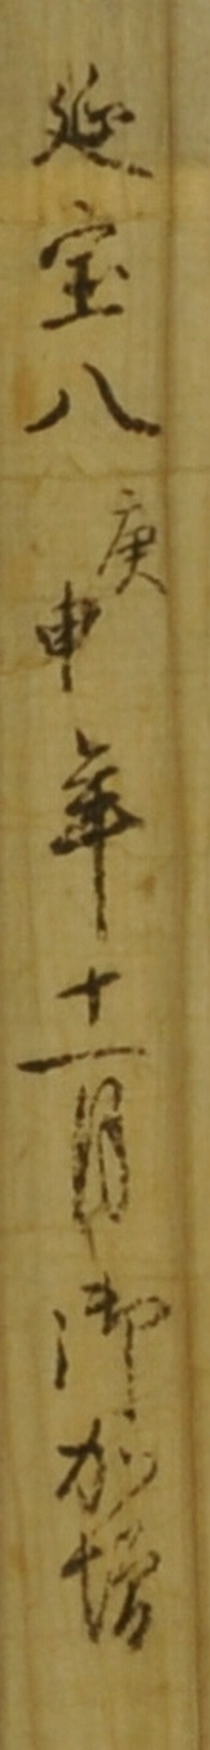延宝八庚申年十一月御加増
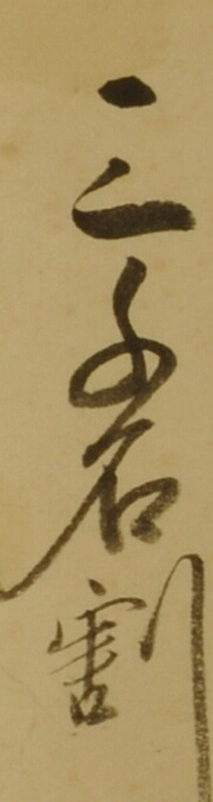三千石割

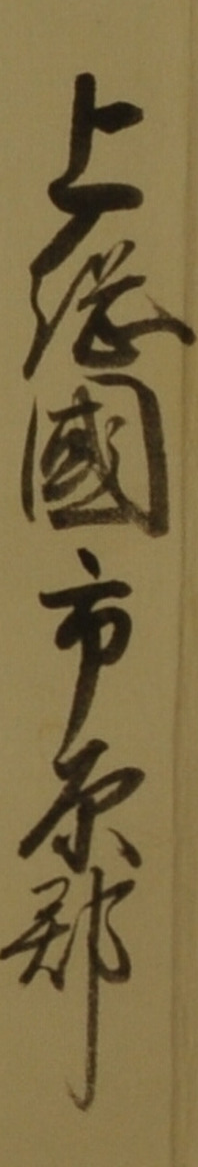上総国市原郡
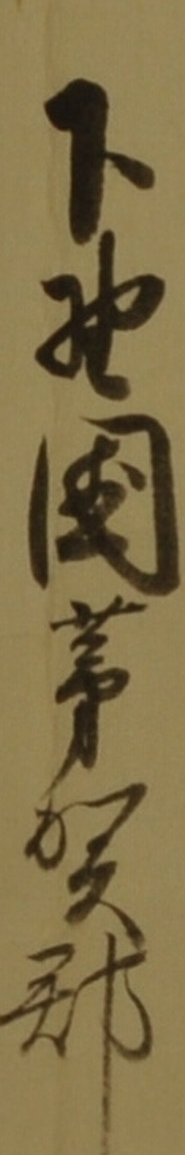下野国芳賀郡
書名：御書出
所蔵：伊那市立高遠町図書館・合同会社AMANE
